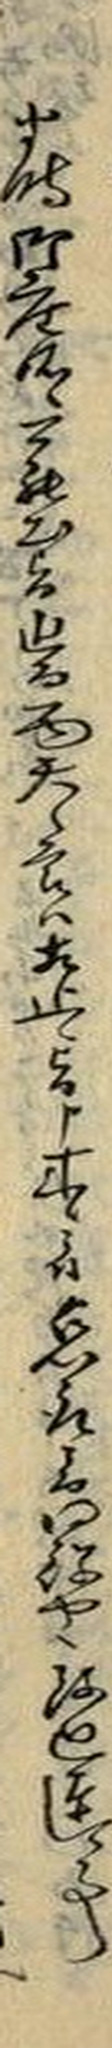半時御座所へ可罷出旨追て雨天之節は相止候旨申来候に付点取にて同役中へ致廻達候事
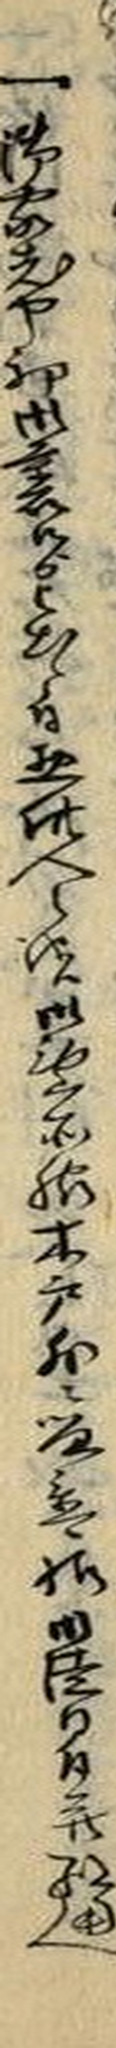一御家老中初御裏口ゟ被出候に付惣供人之儀は御台所脇木戸外に留置候様御徒目付并組用人
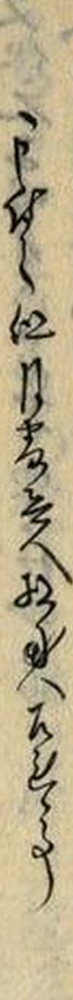へ申付之但月番壱人組用人召連候事
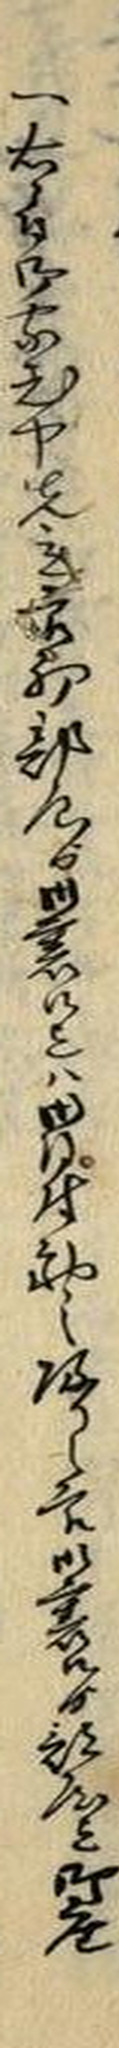一右に付御家老中先立最初部屋ゟ御裏口迄は御目付勤之帰り之節御裏口ゟ部屋迄御座
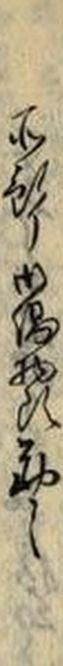所預り御側物頭勤之
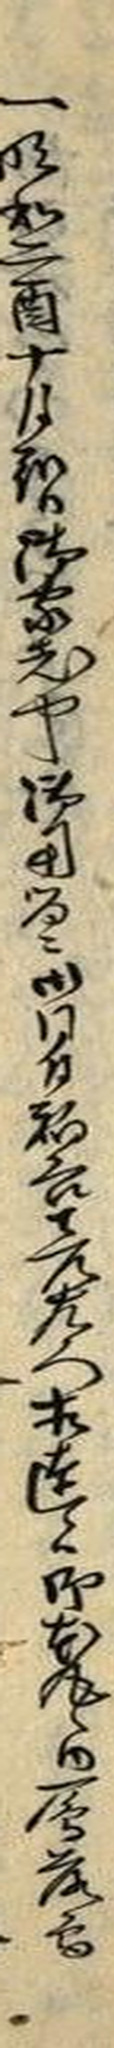一明和二酉十月朔日御家老中御用留に御目付粕谷彦左衛門相達候は御本丸之内鳫落鳥
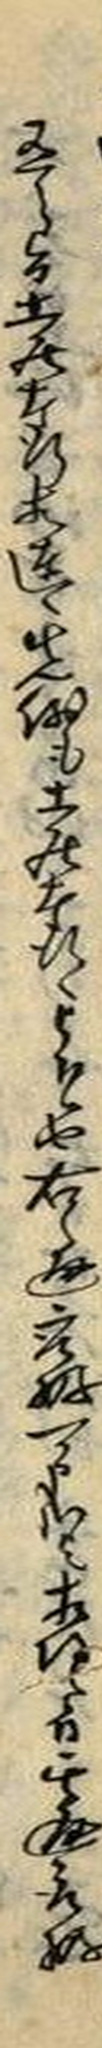有之旨土居奉行相達候先例も土居奉行へ被下候由右之通取扱可申哉と相伺候に付其通取扱
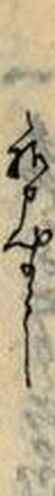候様申聞之
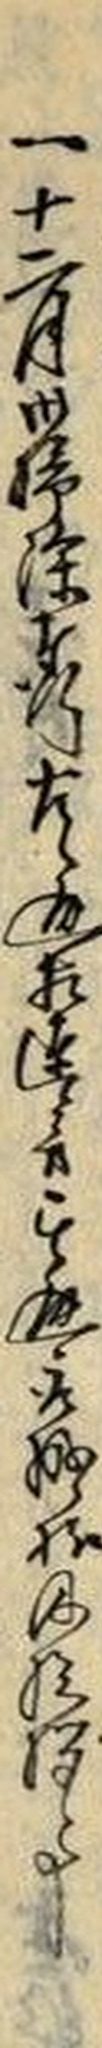一十二月御掃除奉行左之通相達候に付其通取扱候様及挨拶候事
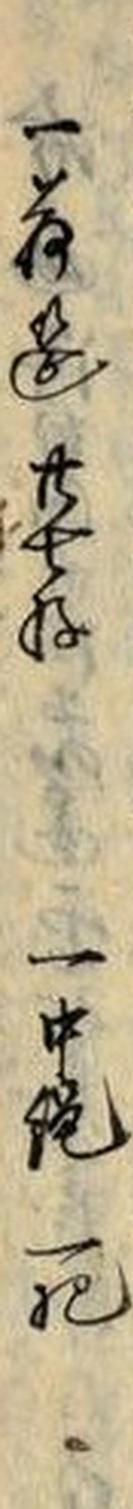一荷莚廿七枚一中縄一把

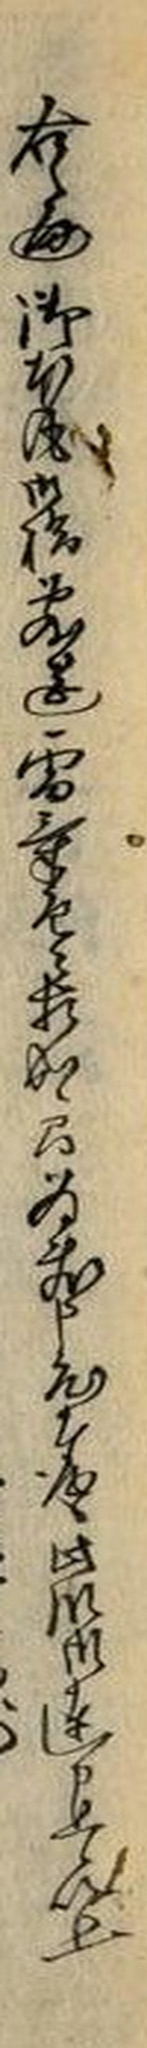右之通御本丸御橋敷辺雪気色に相成候間為敷申度奉存候此段御達申上候以上
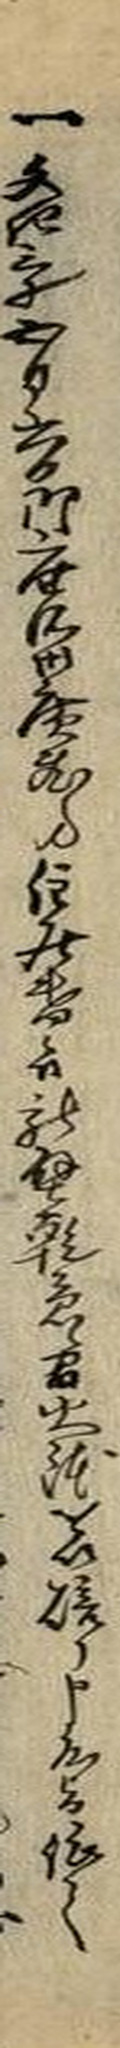一文化三刁五月六日御座所御広敷方住居替に付新壁乾急候間火鉢を以焙り申度旨依之
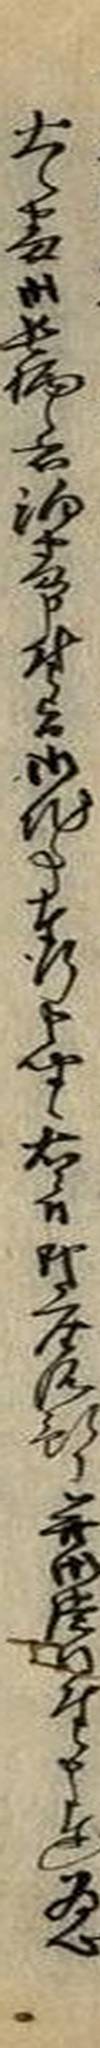火之番御長柄之者泊番申付候旨御作事奉行申聞候右に付御座所預り并御徒目付へ申達為心
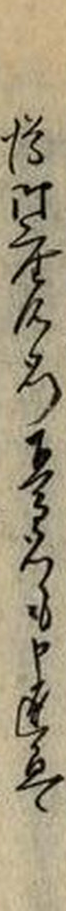得御座所御門下馬御門へも申達置候
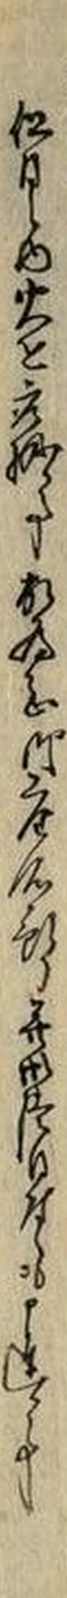但月之内火を取扱候事故為念御座所預り并御徒目付へも申達候事
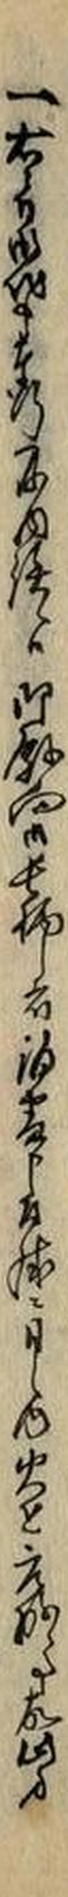一右に付御作事奉行及内談候は御殿向御長柄之者泊番申付捄に月之内火を取扱候事故此方
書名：御城下諸事之部
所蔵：福井県文書館 Fukui Prefectural Archives
